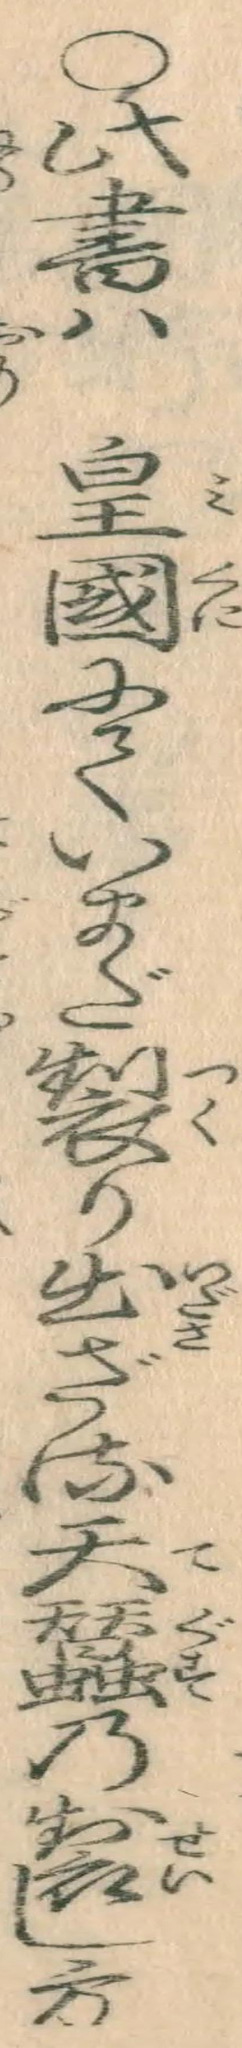○此書は皇国にていまだ製り出ざる天蠺の製し方
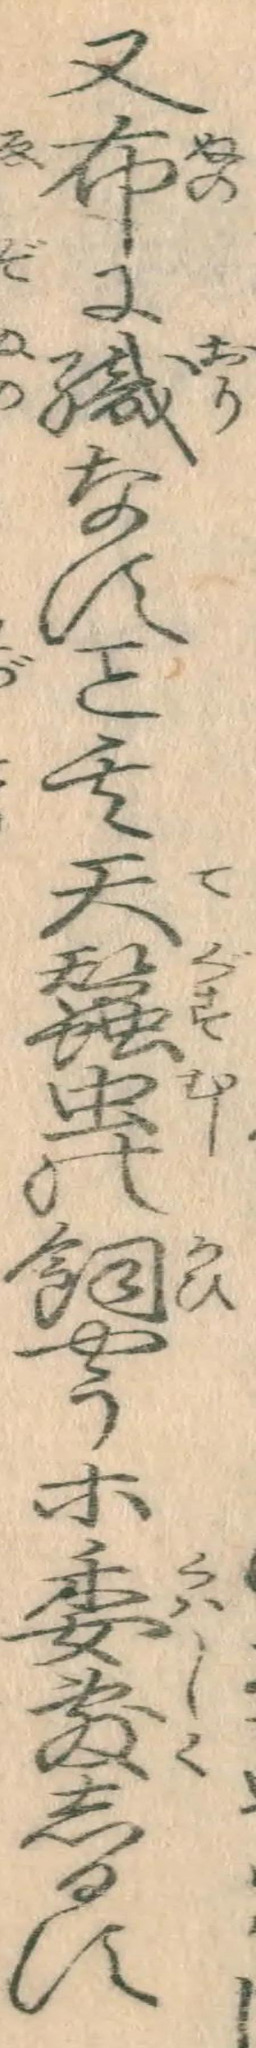又布に織なすこと其天蠶虫の飼やう等委敷しるす
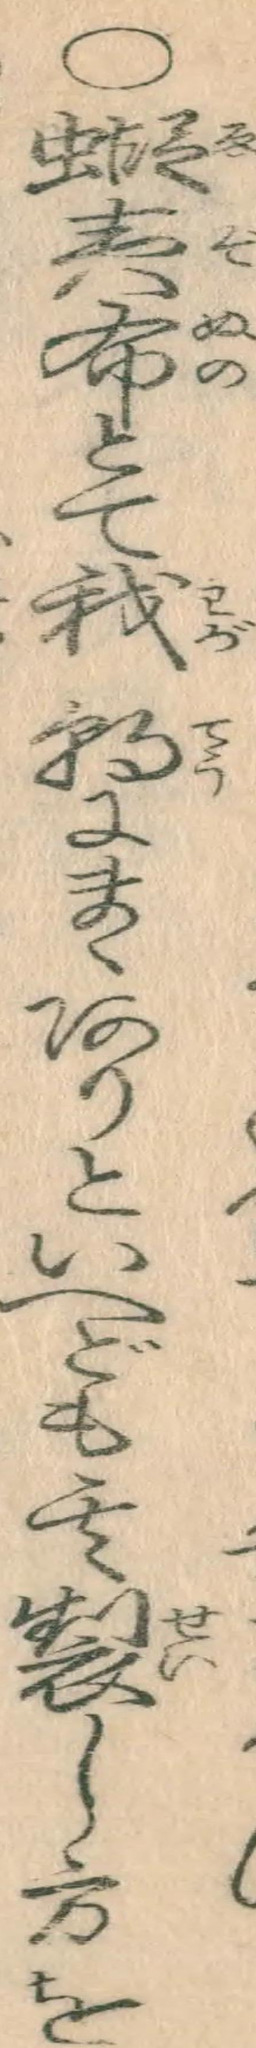○蝦夷布とて我朝にまゝありといへども其製し方を
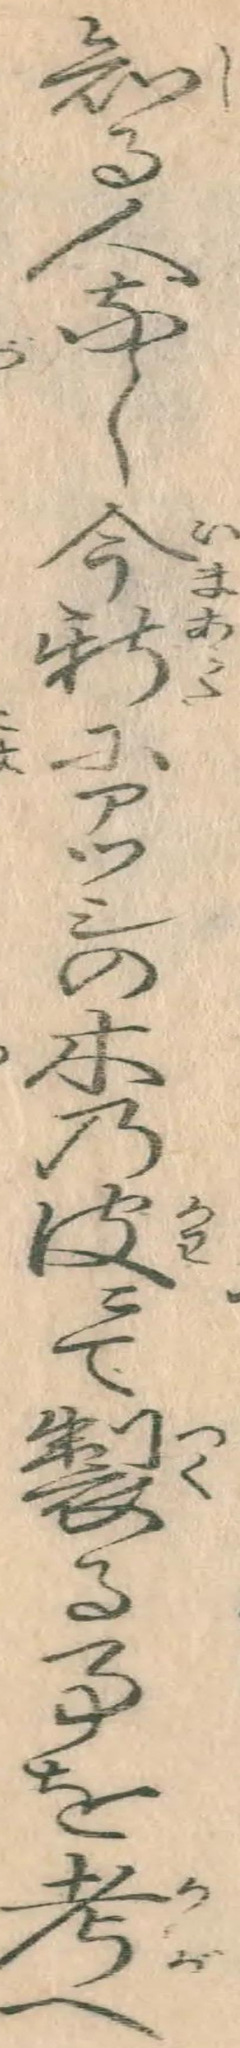知る人なし今新にアツシの木の皮にて製る事を考へ
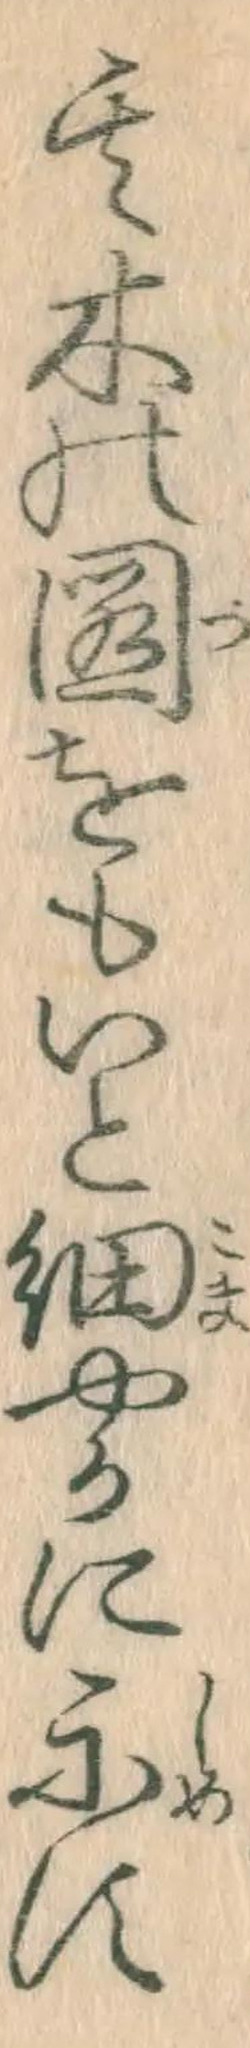其木の圖をもいと細やかに示す
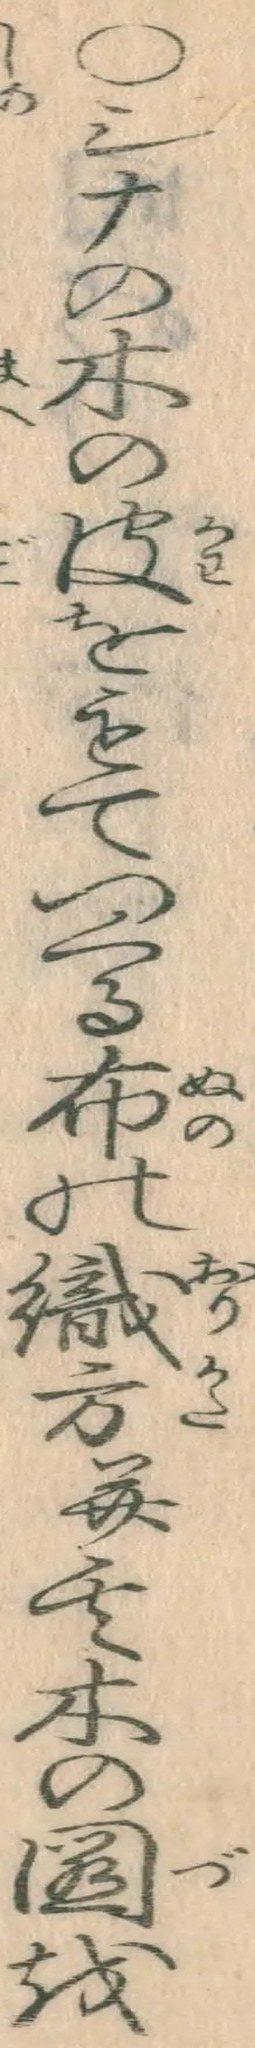○シナの木の皮をもてつくる布の織方幷其木の圖を
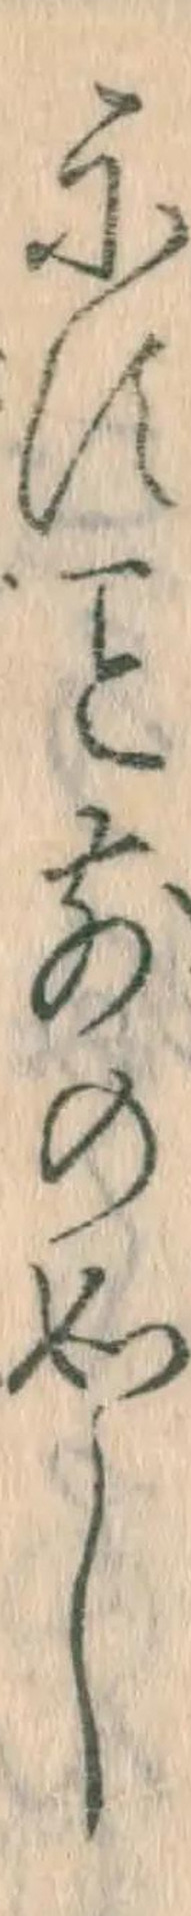示すこと前の如し
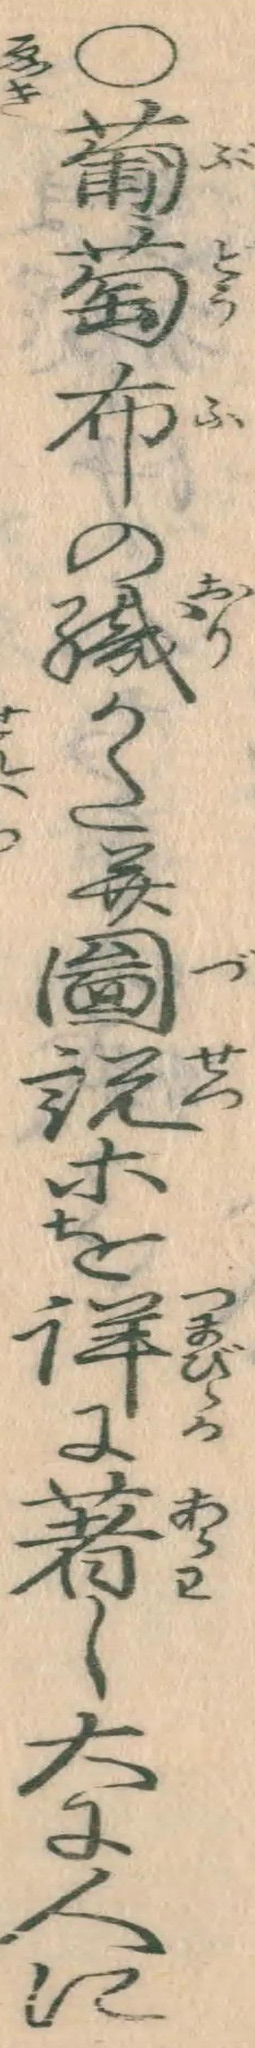○葡萄布の織かた幷圖説等を詳に著し大に人に
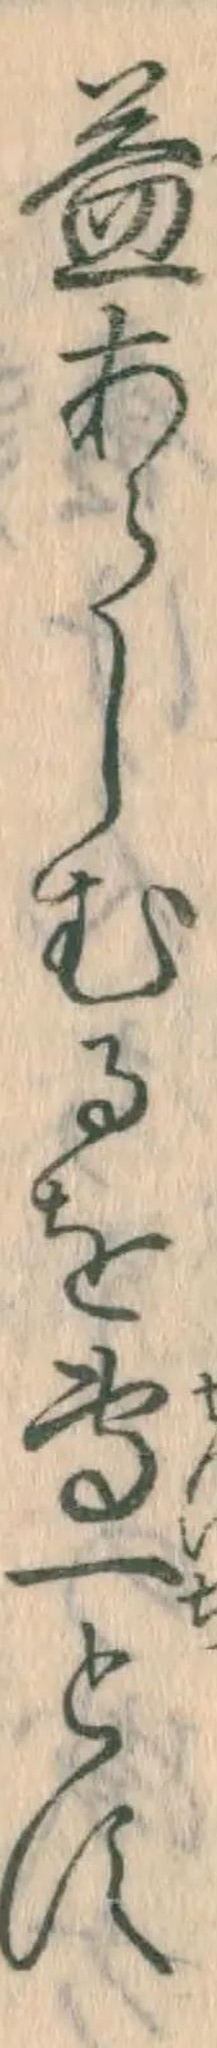益あらしむるを専一とす
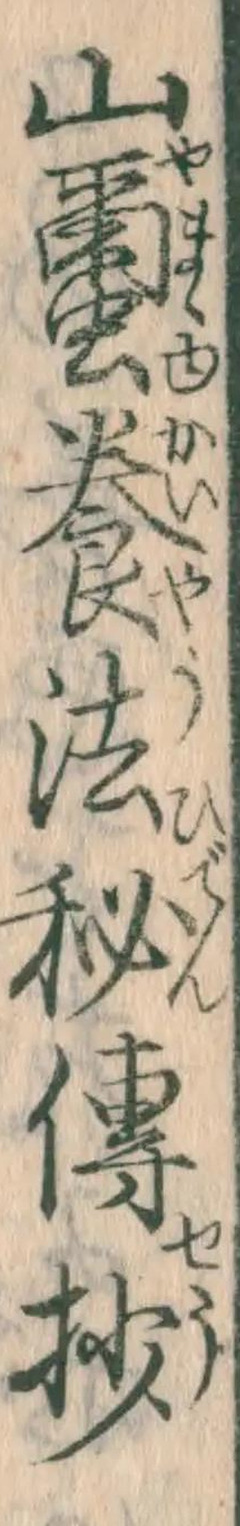山繭養法秘傳抄
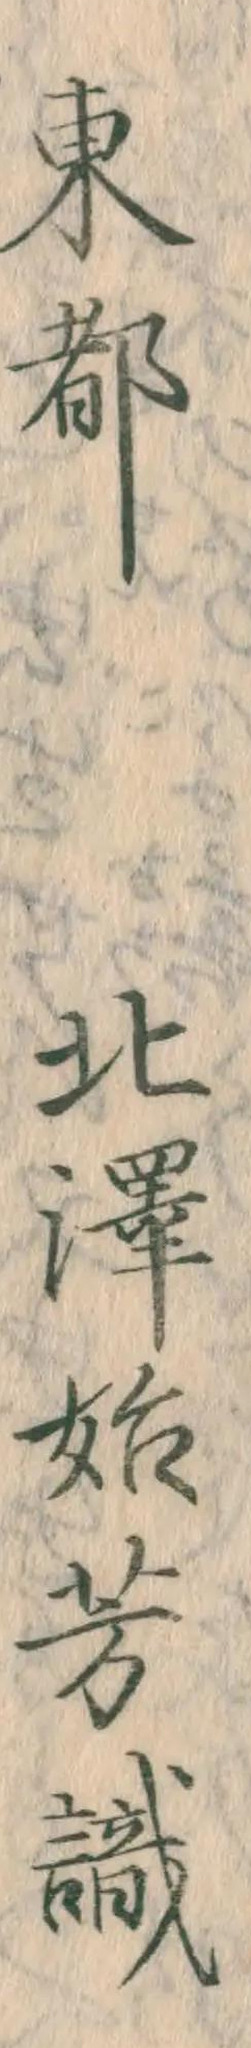東都北澤始芳識
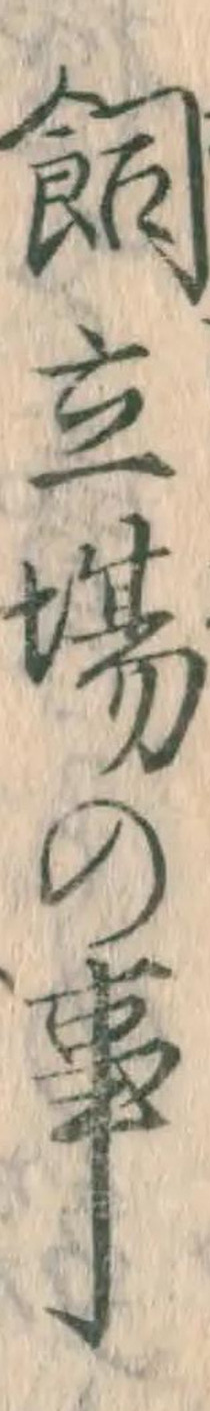飼立場の事
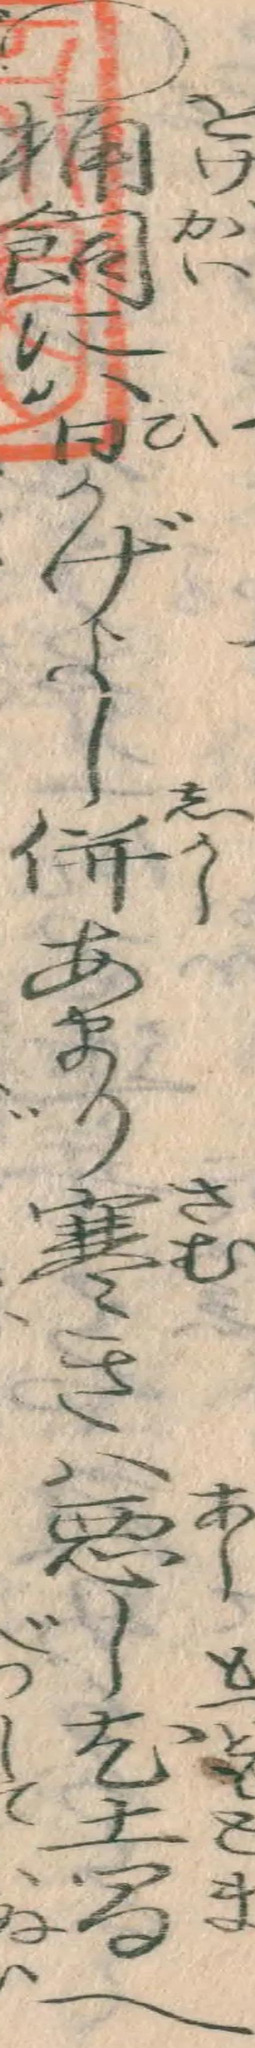○桶飼には日かげよし併あまり寒きは悪し尤土間へ
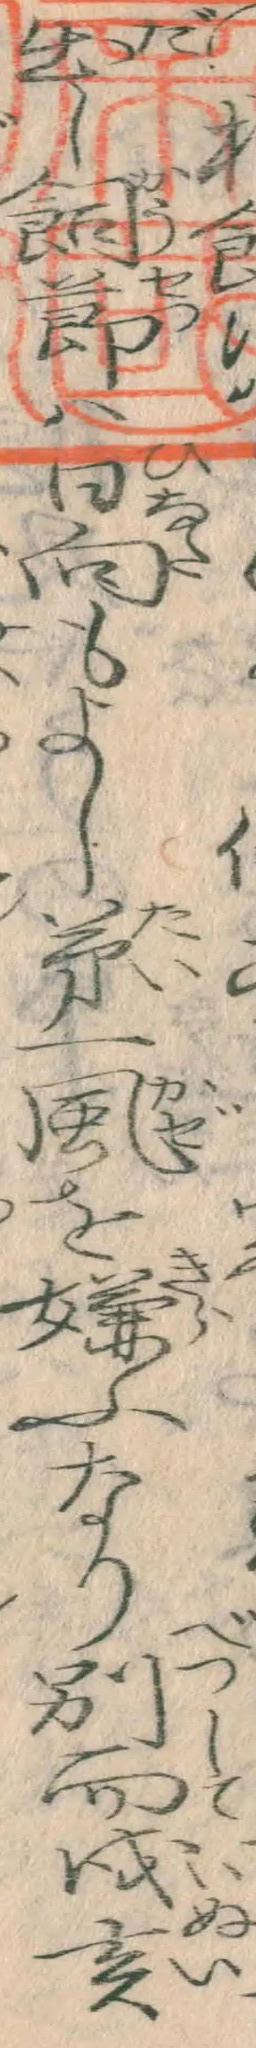出し飼節は日向もよし第一風を嫌ふなり別而戌亥
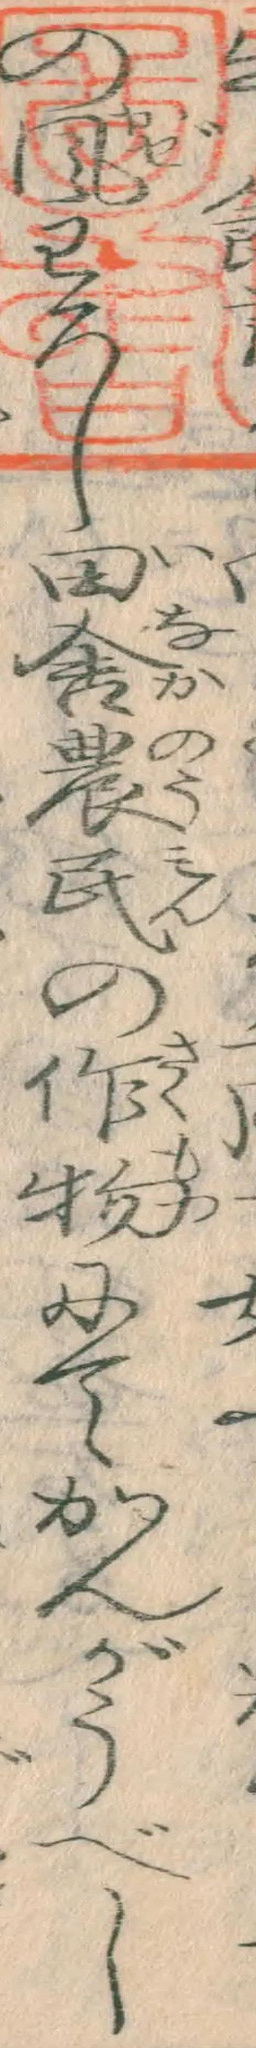の風わろし田舎農民の作物にてかんがうべし
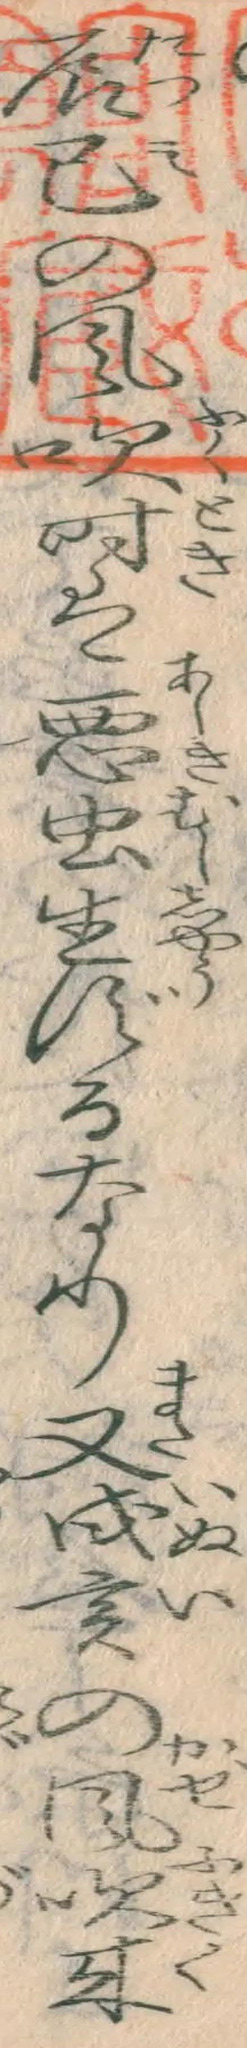辰巳の風吹時は悪虫生ずるなり又戌亥の風吹来
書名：山繭養法秘傳抄
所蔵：国立国会図書館 National Diet Library, JAPAN
